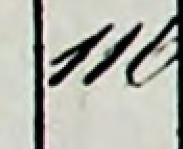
116
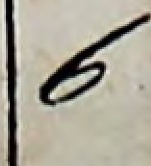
6
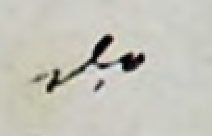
do
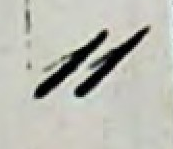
11
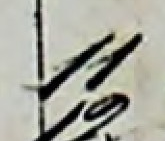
11
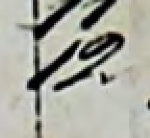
12
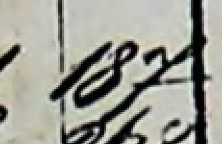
187
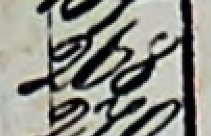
268
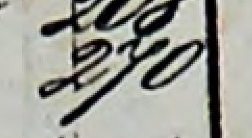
270
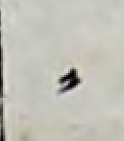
„
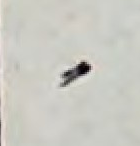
„
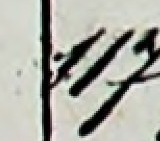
117
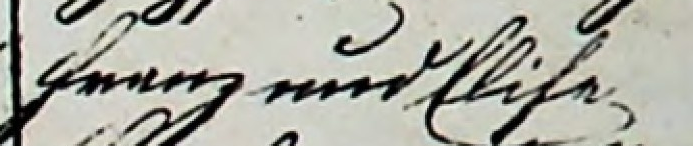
Franz und Elise
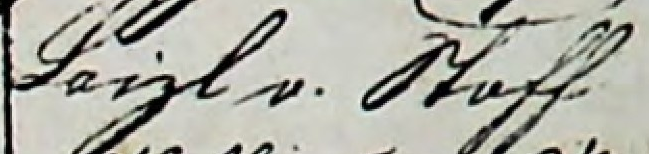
Loizl v. Stoff
